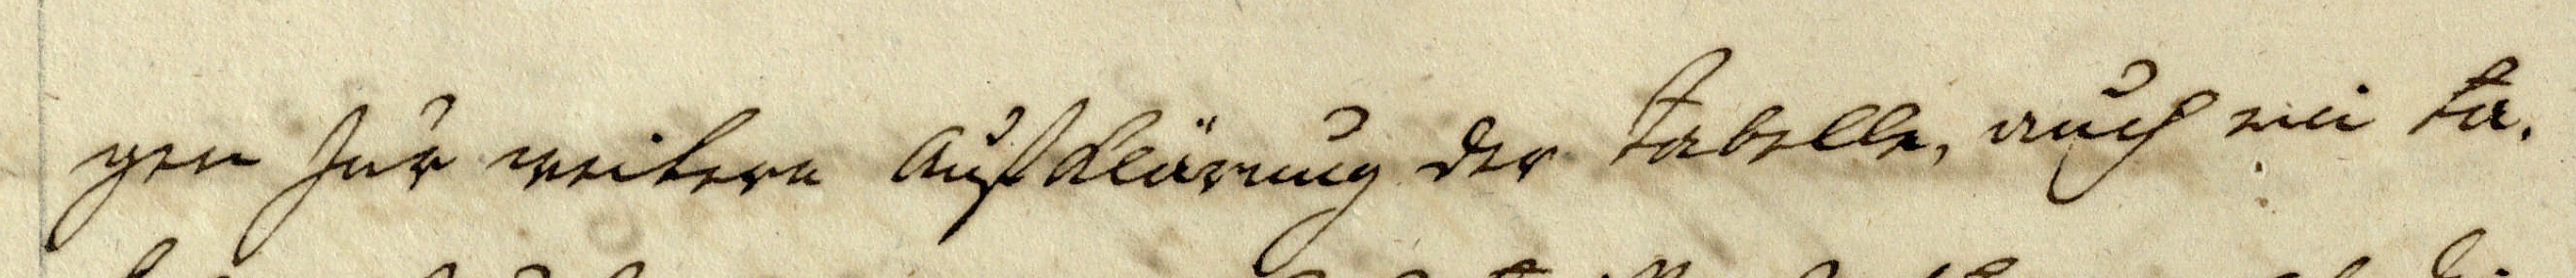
gen zur weitern Aufklärung der Tabelle, auch ein ta¬
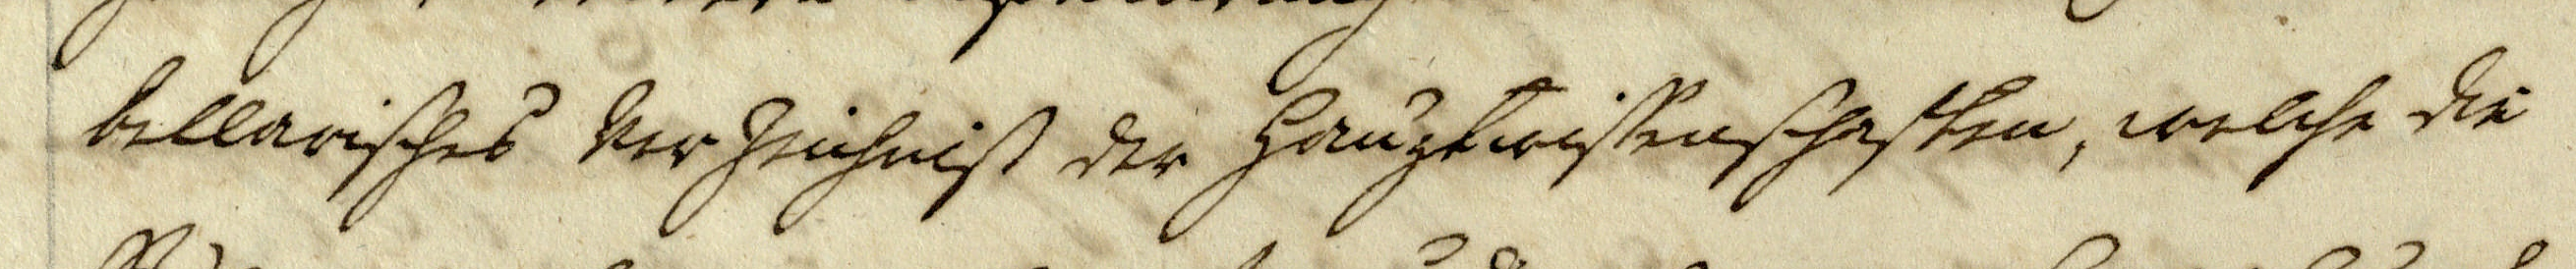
bellarisches Verzeichniß der Hauptwissenscheften, welche die
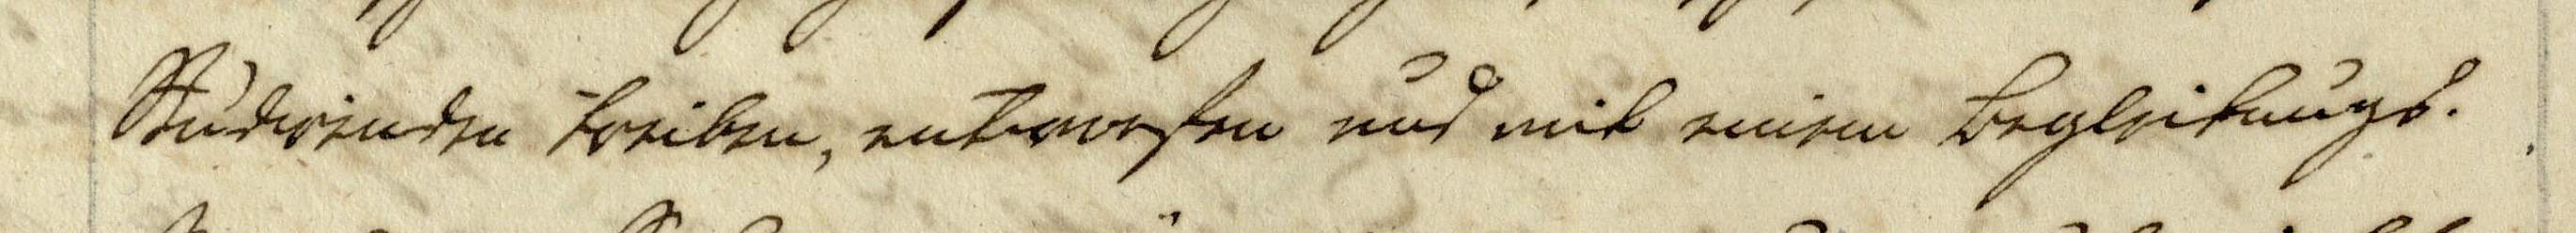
Studirenden treiben, entworfen und mit einem Begleitungs¬
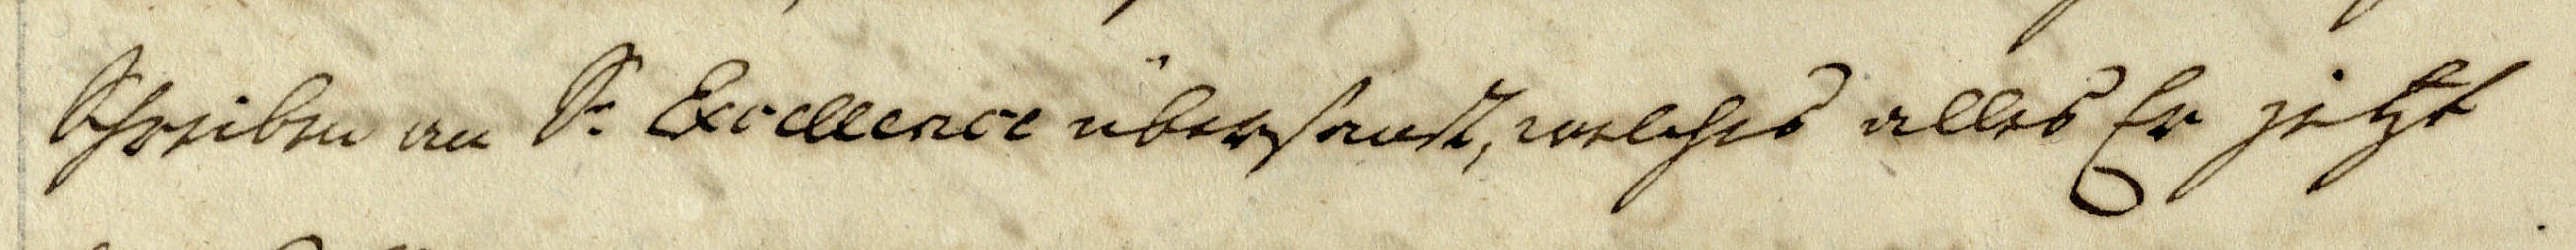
Schreiben an Sr Excellence übersandt, welches alles Er jetzt
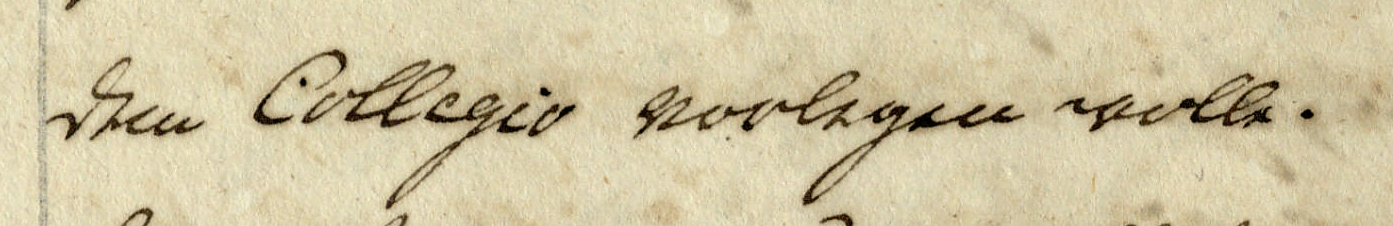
dem Collegio vorlegen wolle.
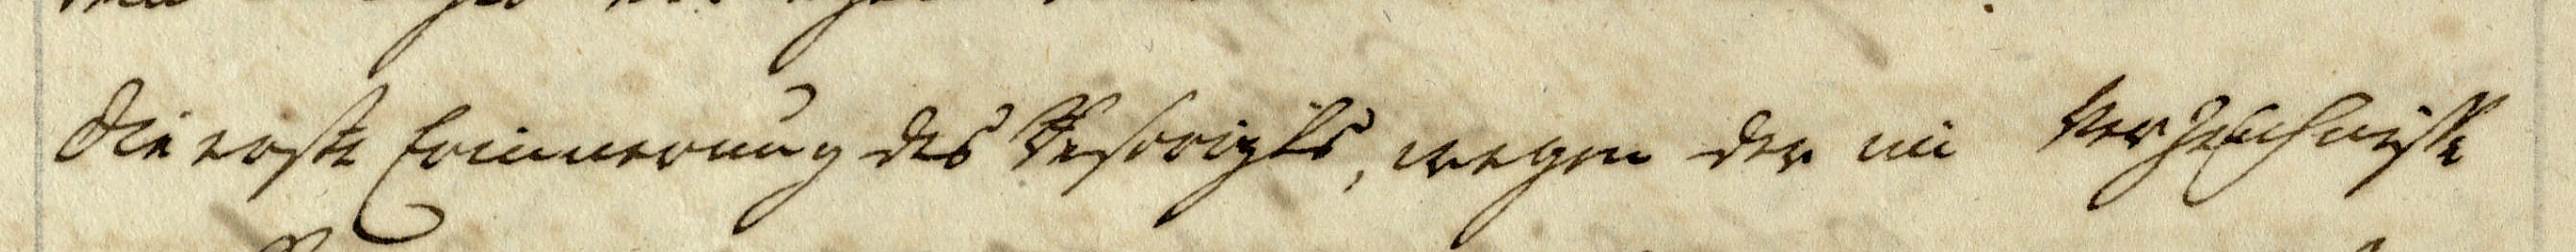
Die erste Erinnerung des Rescripts, wegen der in Verzeichnisse
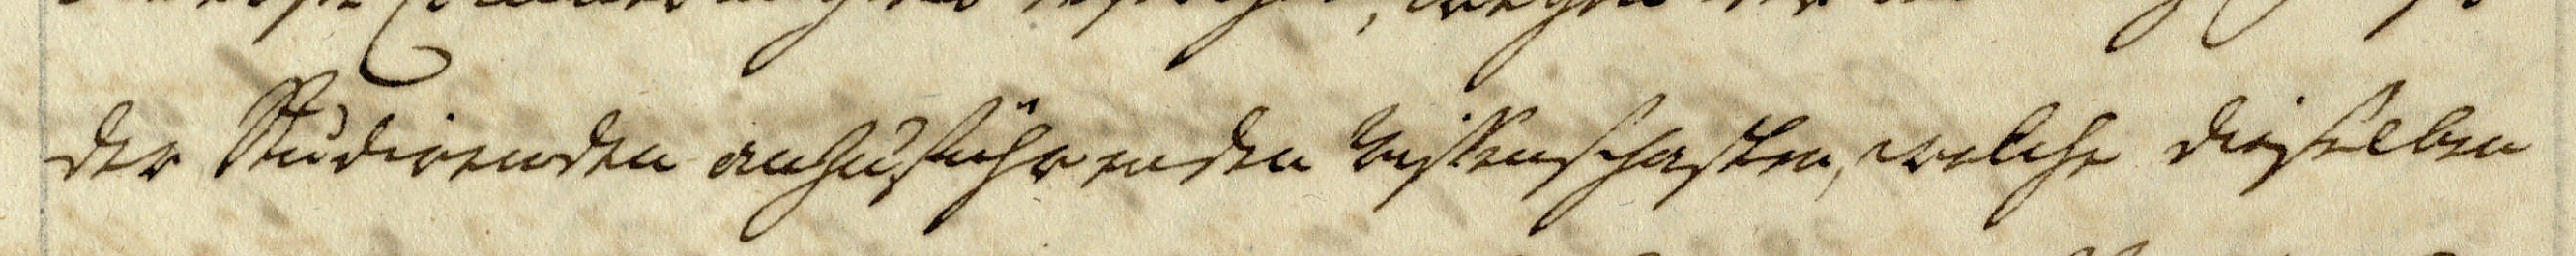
der Studirenden anzuführenden Wissenschaften, welche dieselben
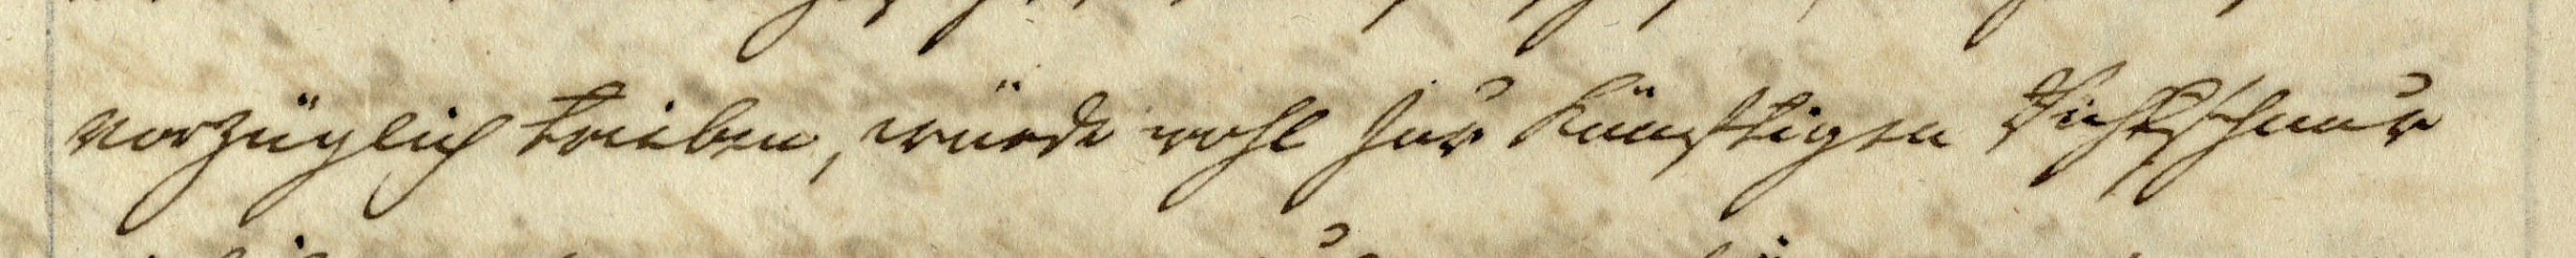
vorzüglich trieben, würde wohl zur künftigen Richtschnur
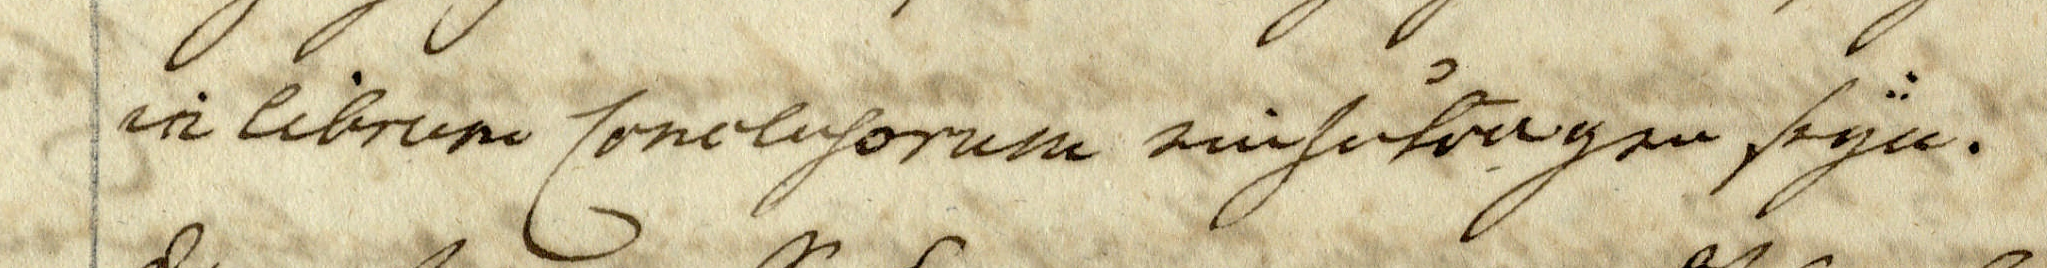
in librum Conclusorum einzutragen seÿn.
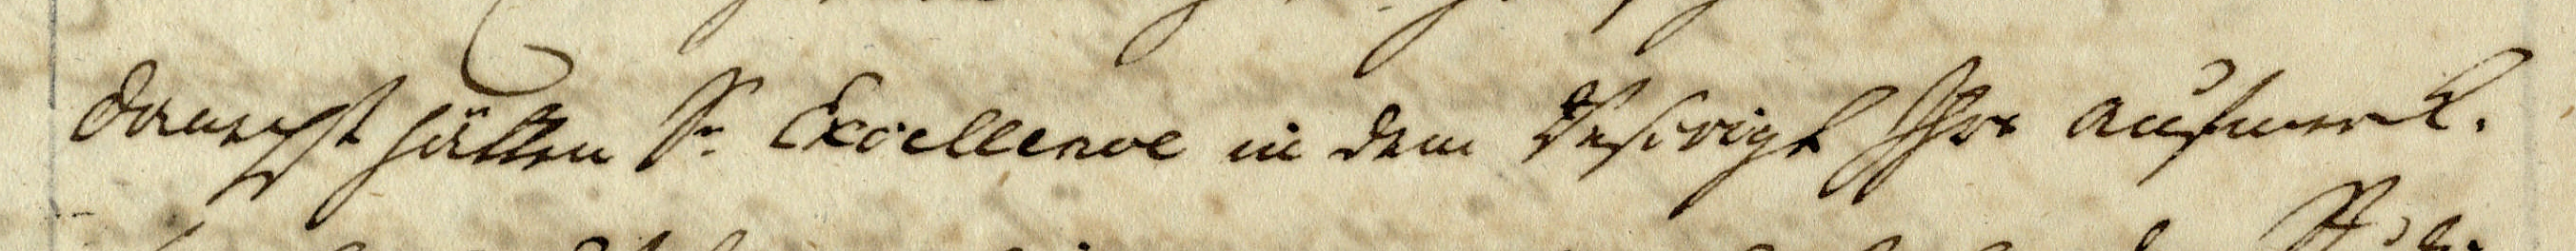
Danechst hätten Sr. Excellence in dem Rescript ihre Aufmerk¬
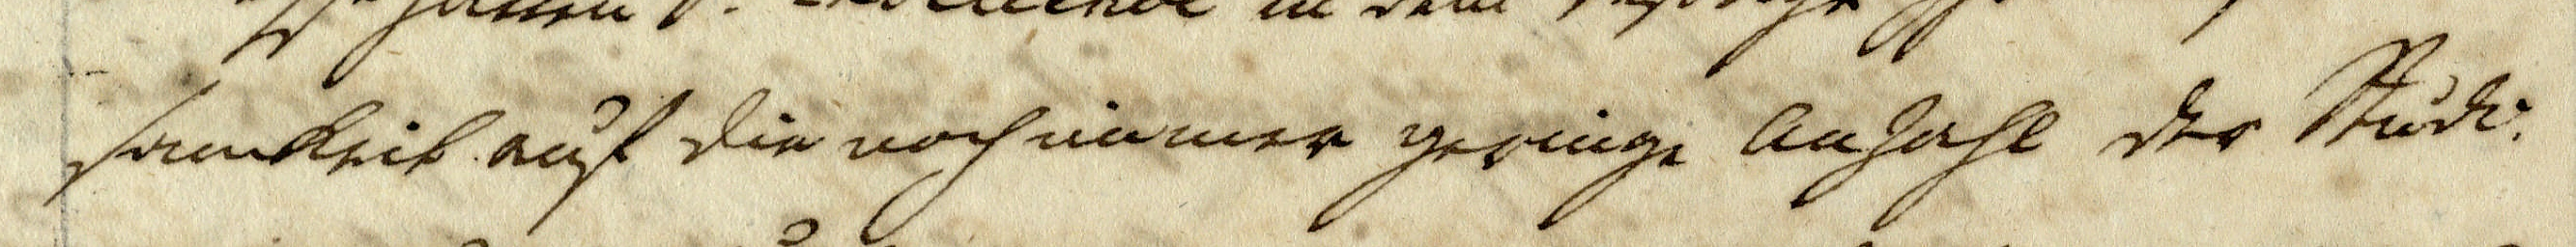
samkeit auf die noch immer geringe Anzahl der Studi¬
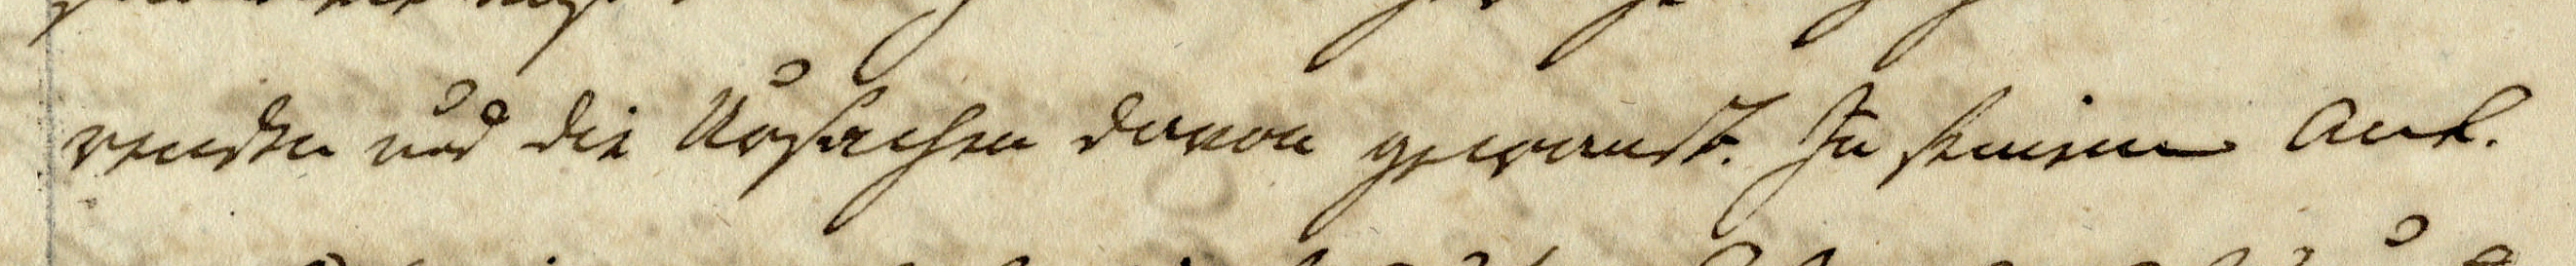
renden und die Ursachen davon gewandt. In seinem Ant¬
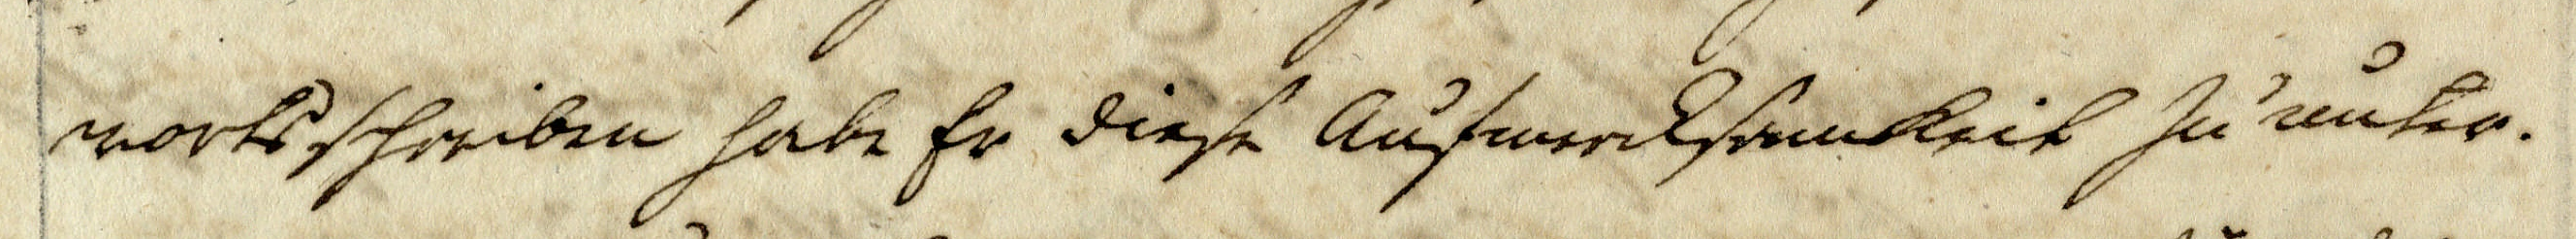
wortsschreiben habe Er diese Aufmercksamkeit zu unter¬
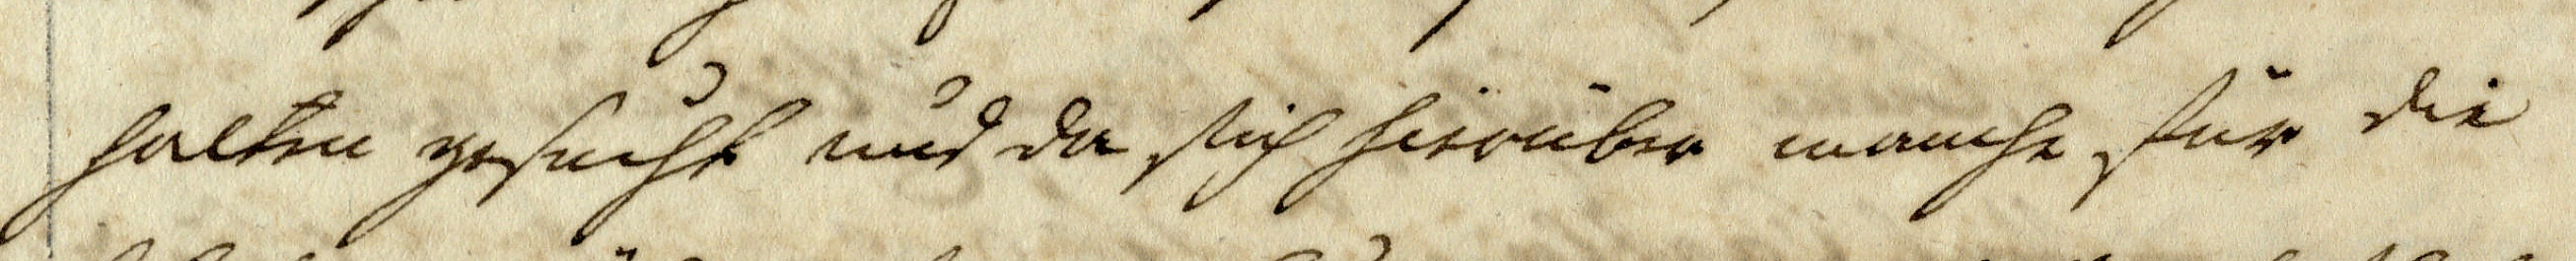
halten gesucht und da sich hierüber manche für die
